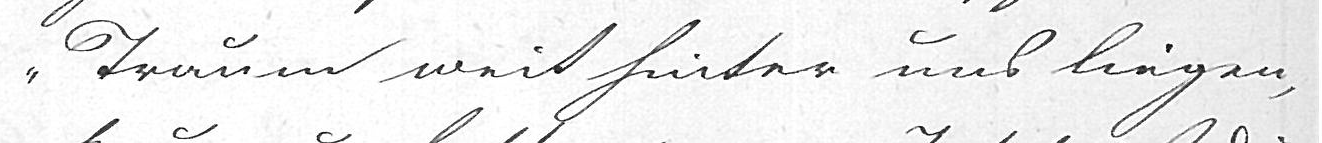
" Traum weit hinter uns liegen,
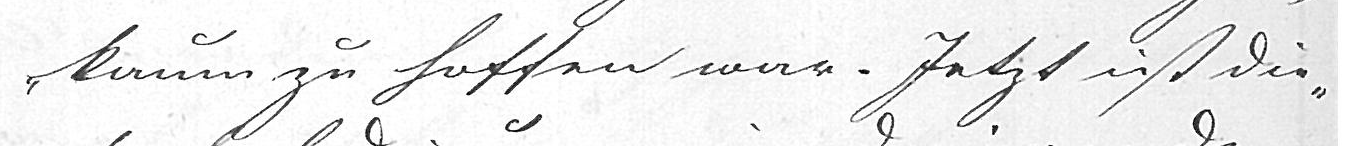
" kaum zu hoffen war. Jetzt ist die-
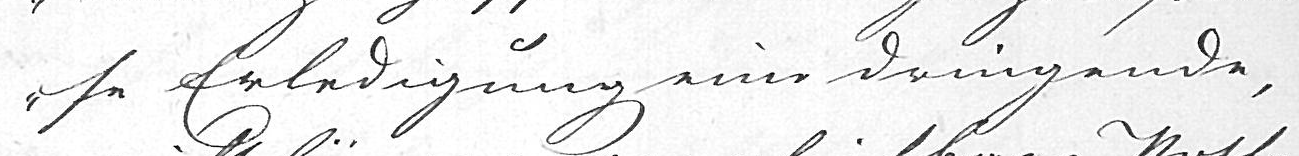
" se Erledigung eine dringende,
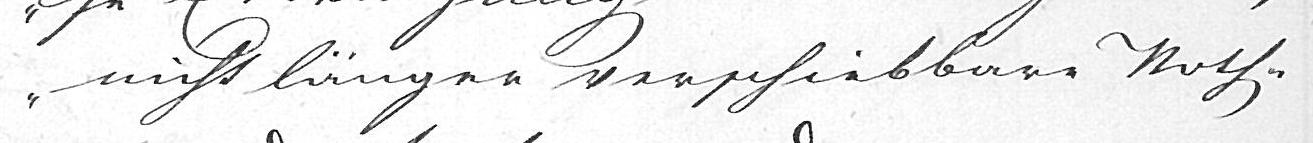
" nicht länger verschiebbare Noth-
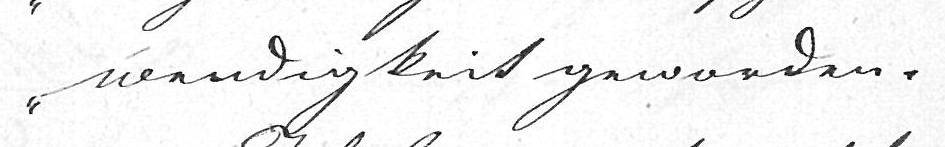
" wendigkeit geworden.
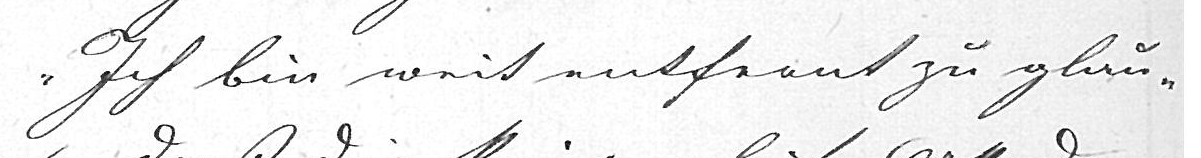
" Ich bin weit entfernt zu glau-
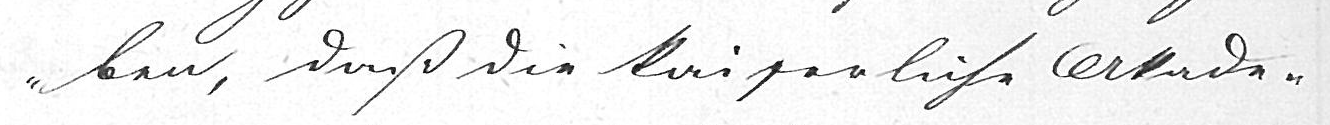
" ben, daß die kaiserliche Akade-
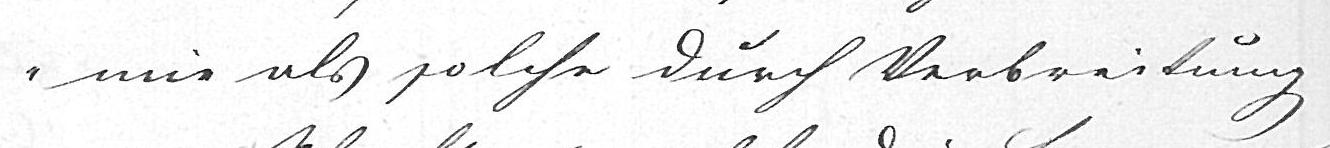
" mie als solche durch Verbreitung
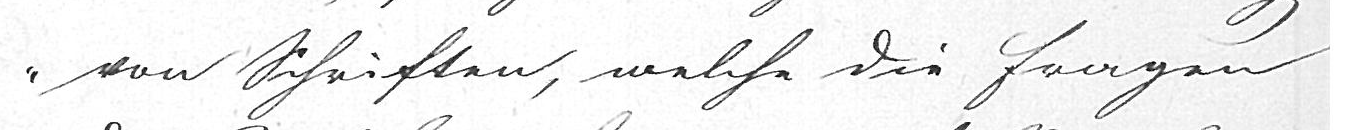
" von Schriften, welche die Fragen
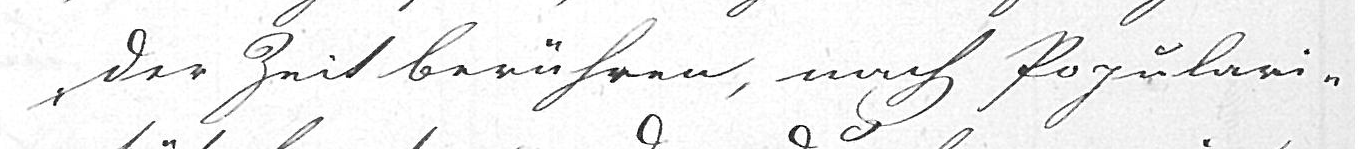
" der Zeit berühren, nach Populari-
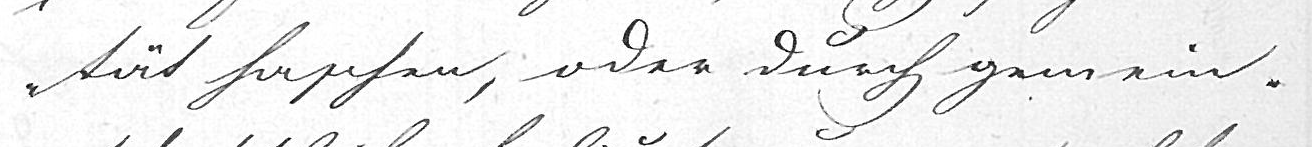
" tät haschen, oder durch gemein-
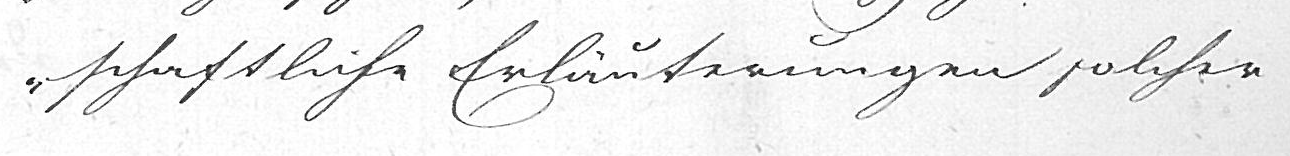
" schaftliche Erläuterungen solcher
